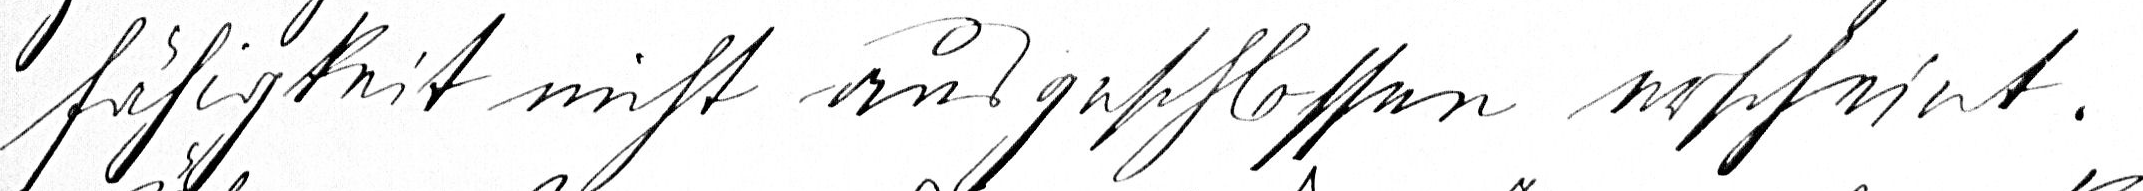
fähigkeit nicht ausgeschlossen erscheint.
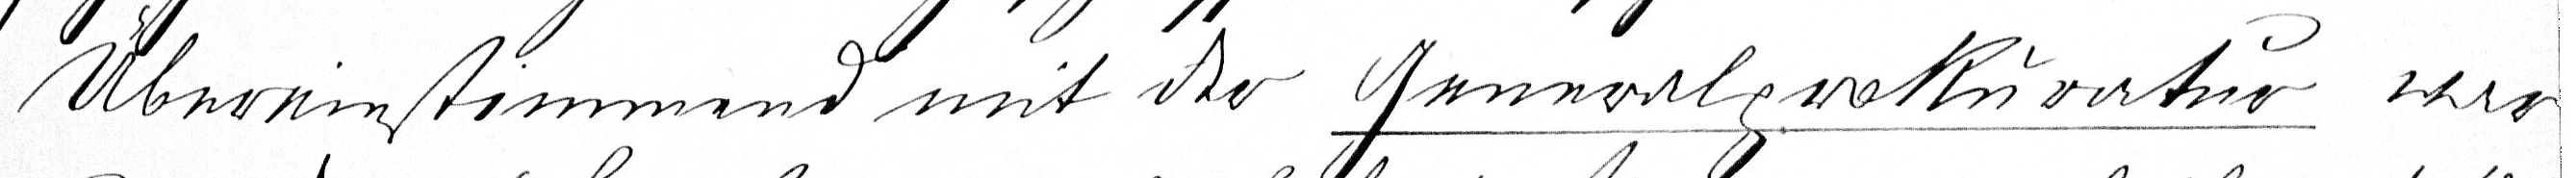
Übereinstimmend mit der Generalprokuratur war
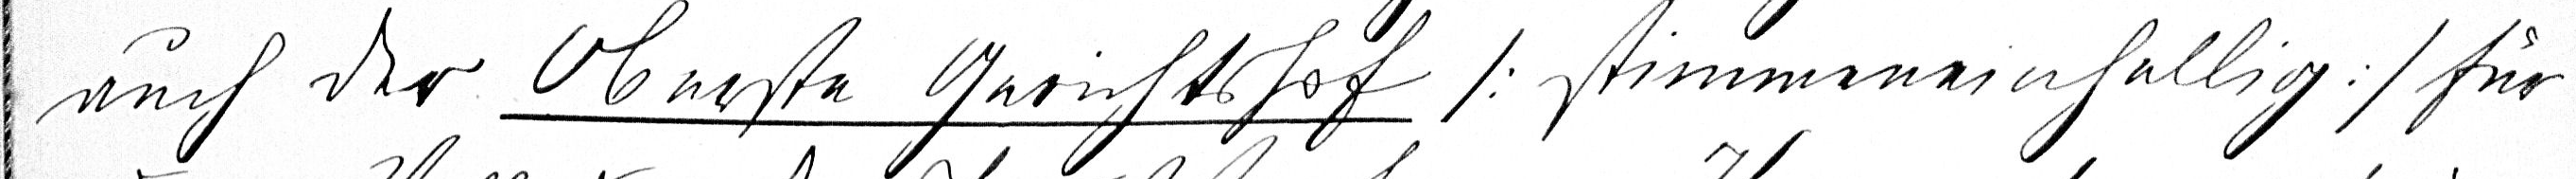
auch der Oberste Gerichtshof /: stimmeneinhellig :/ für
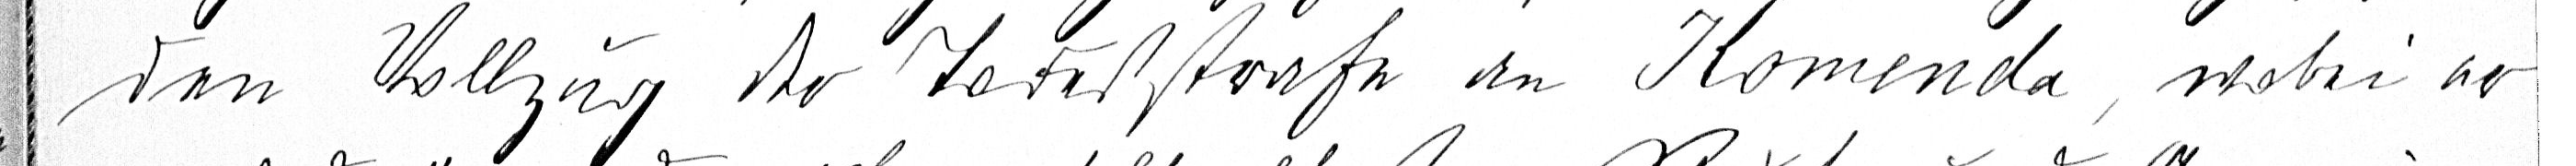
den Vollzug der Todesstrafe an Komenda, wobei er
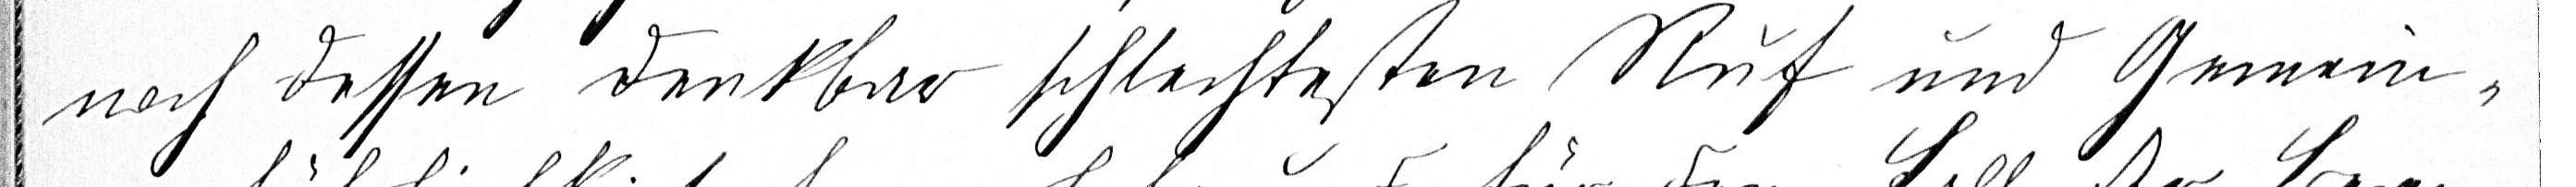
noch dessen denkbar schlechtesten Ruf und Gemein¬
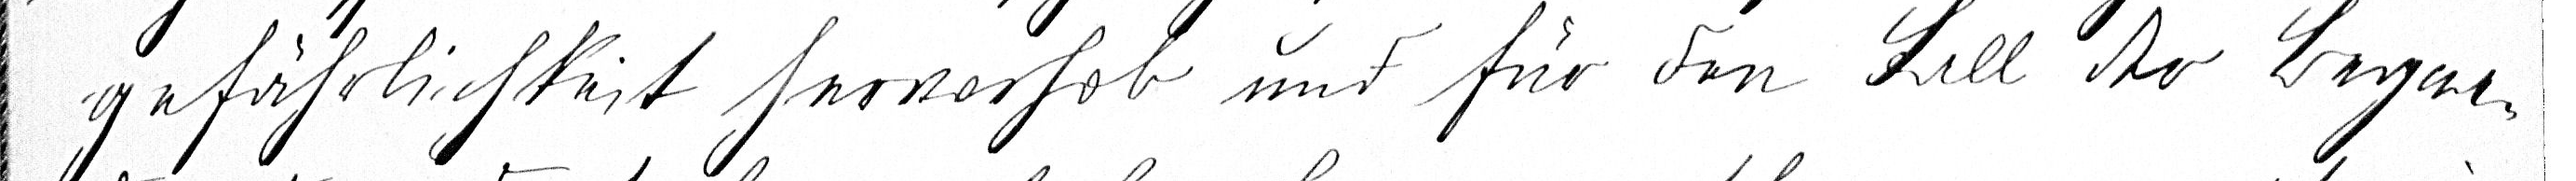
gefährlichkeit hervorhob und für den Fall der Begna¬
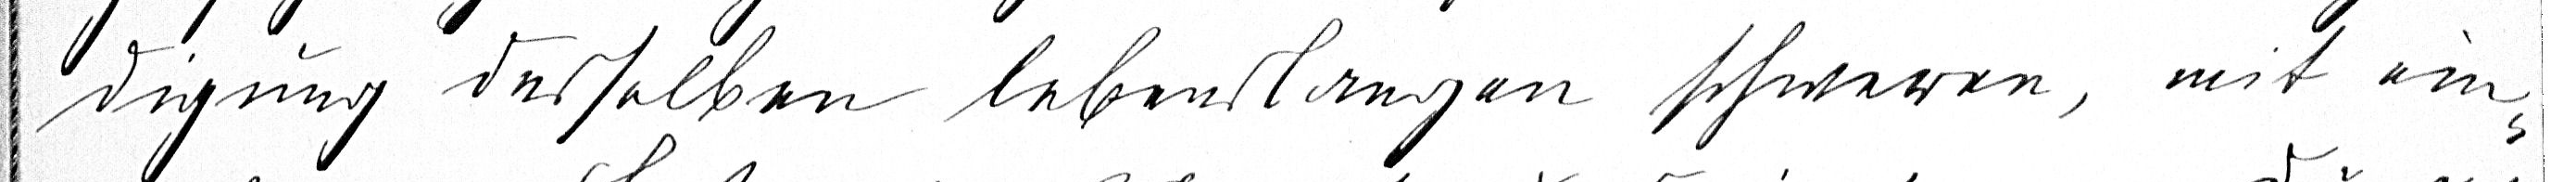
digung desselben lebenslangen schweren, mit ein¬
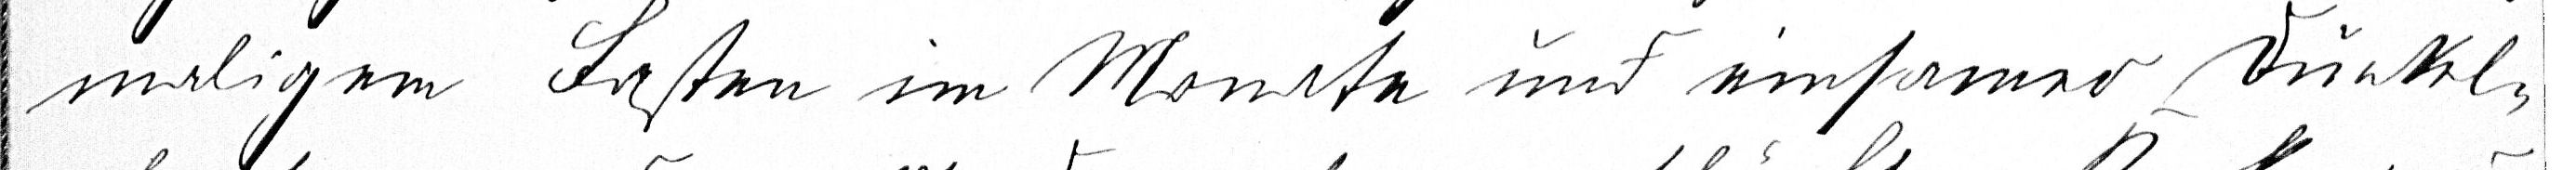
maligem Festen im Monate und einsamer Dünkel¬
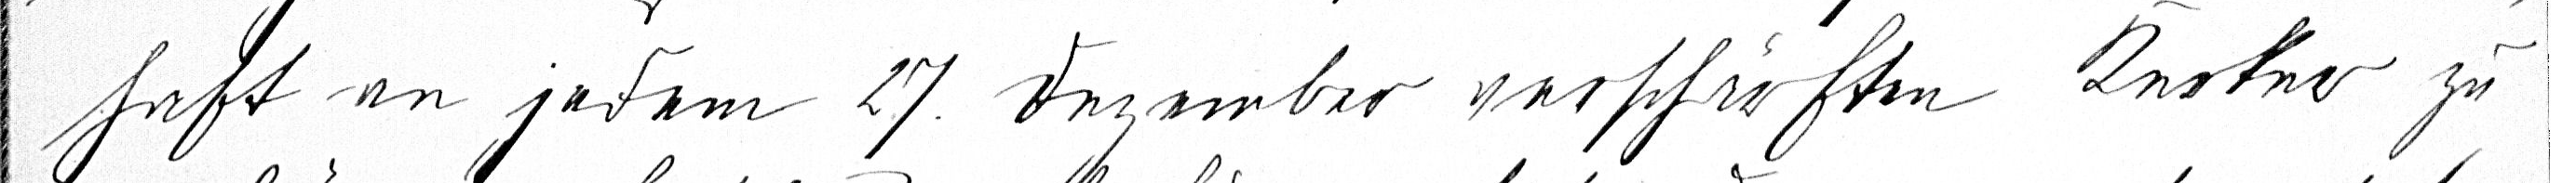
haft an jedem 27. Dezember verschärften Kerker zu
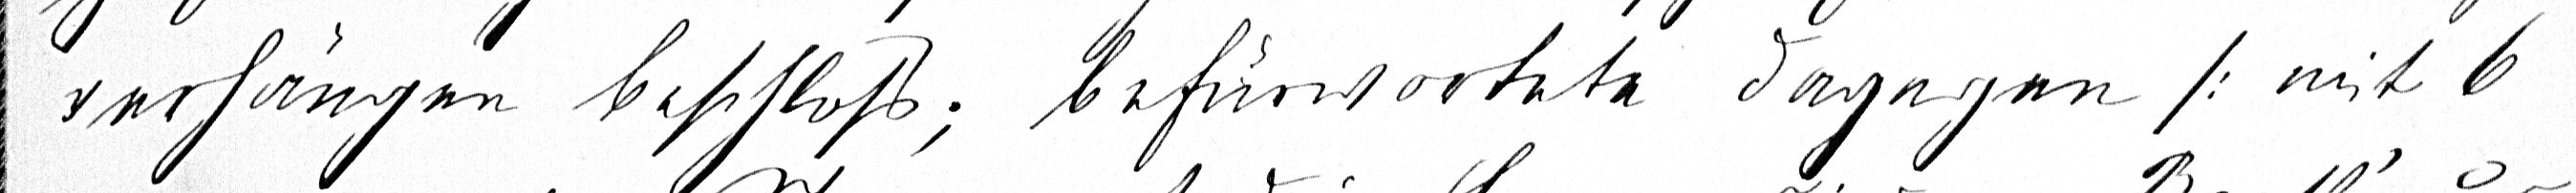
verhängen beschloss; befürwortete dagegen /: mit 6
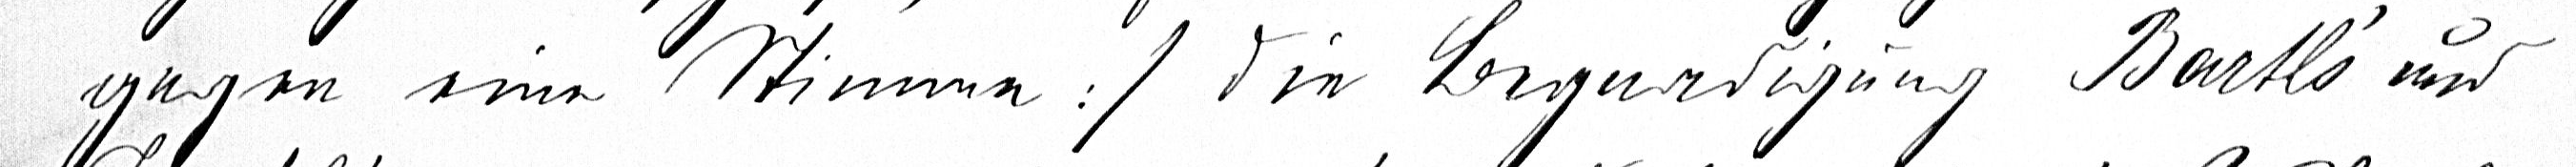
gegen eine Stimme :/ die Begnadigung Bartl's und
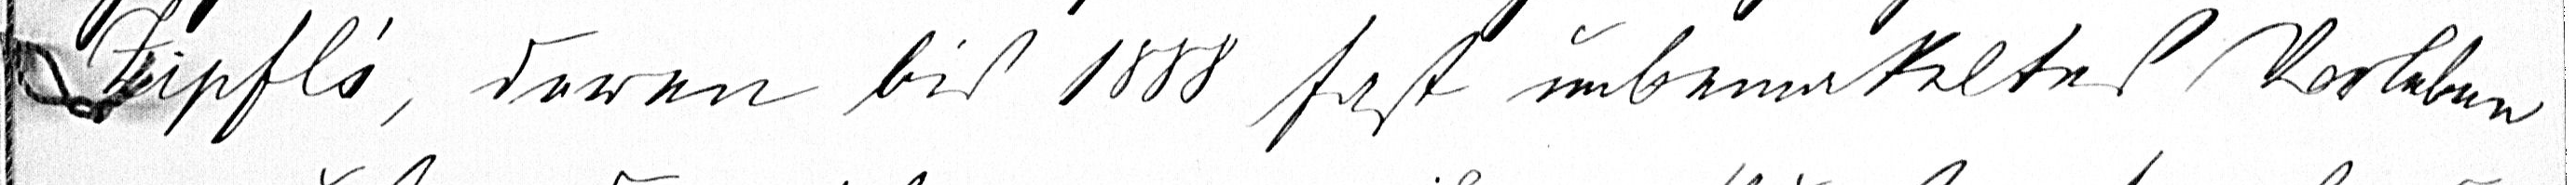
Zipfl's, deren bis 1888 fast unbemakeltes Vorleben
